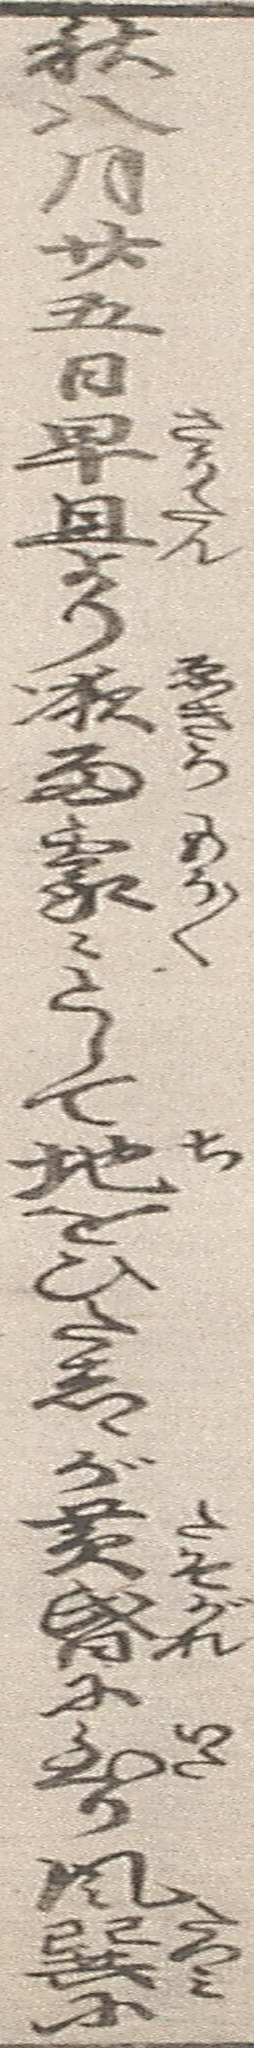秋八月廿五日早旦より液雨蒙々として地をひたしゝが黄昏に至り風巽に
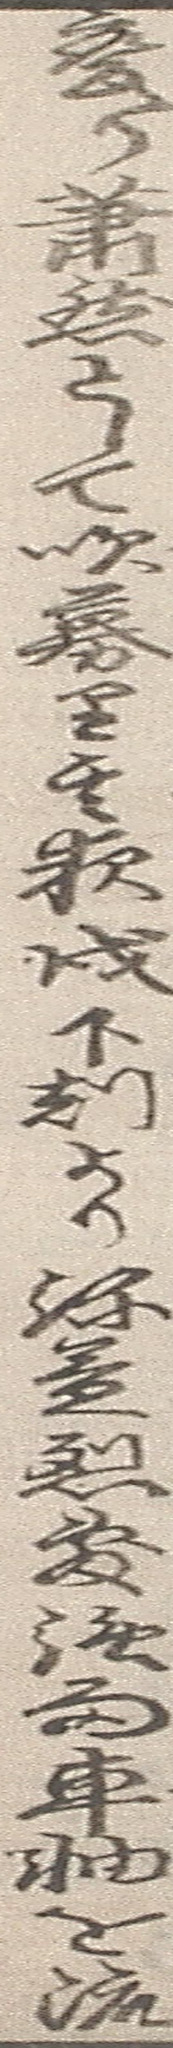変り蕭然として吹募り其夜戌下刻より弥益烈敷強雨車軸を流
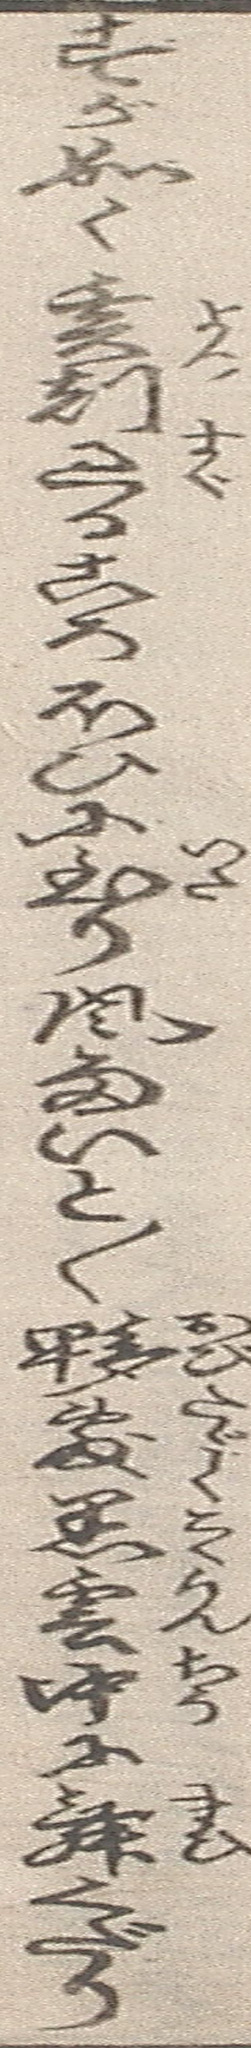すが如く亥刻過るころほひに至り風雨いと〳〵夥敷黒雲中に舞くだり
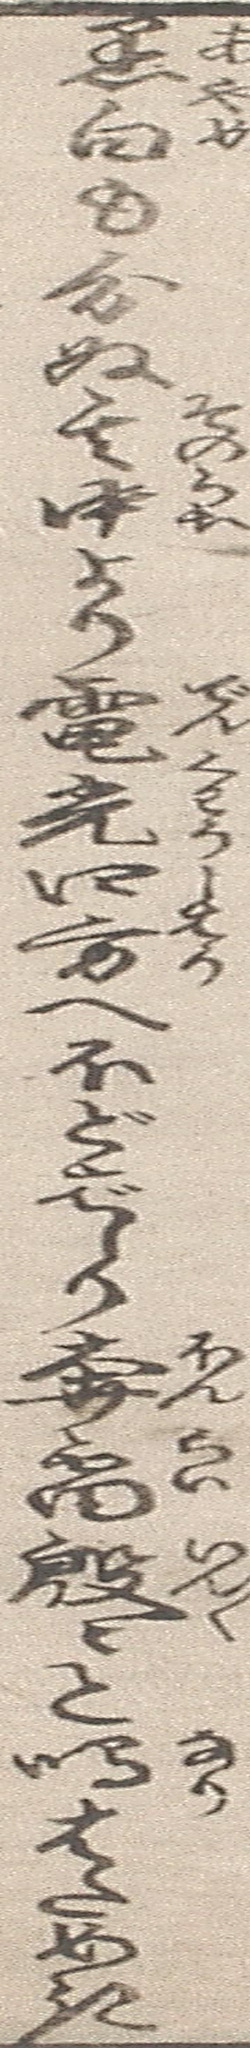黑白も分ぬ其中より電光四方へほどばしり奔雷殷々と鳴はためき
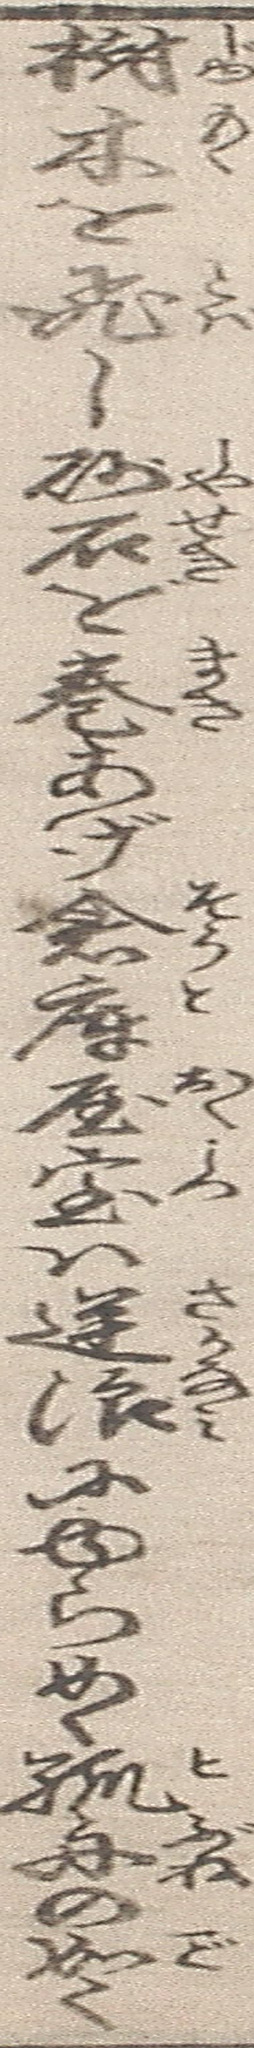樹木を飛し砂石を巻あげ倉庫屋室ハ逆浪にゆらめく孤舟の如く
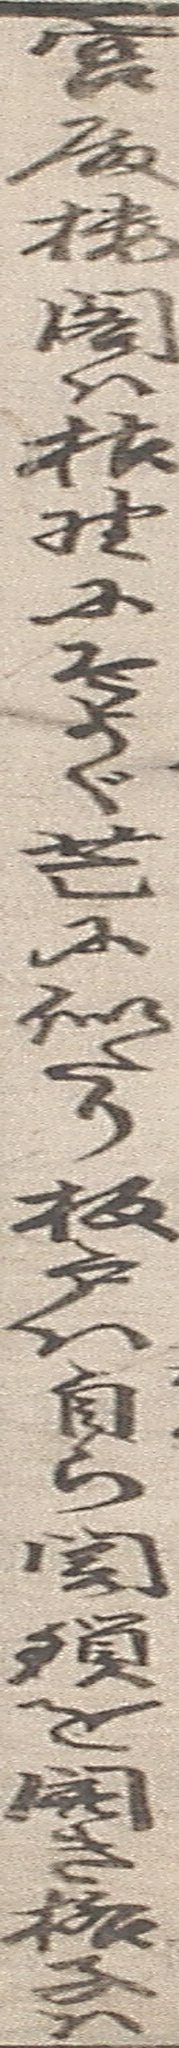宮殿楼閣ハ枯野にそよぐ芒に似たり板戸ハ自ら閉鎖を開き格子ハ
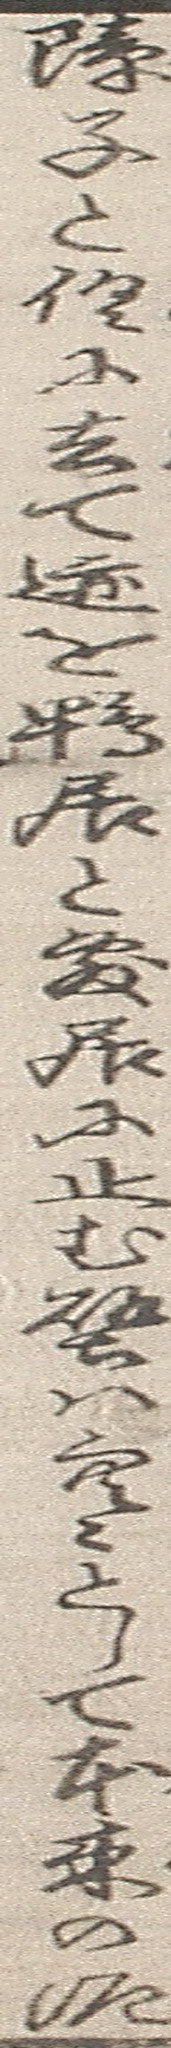障子と俱に去て迹を鴨居と敷居に止む壁ハ空々として本来の泥
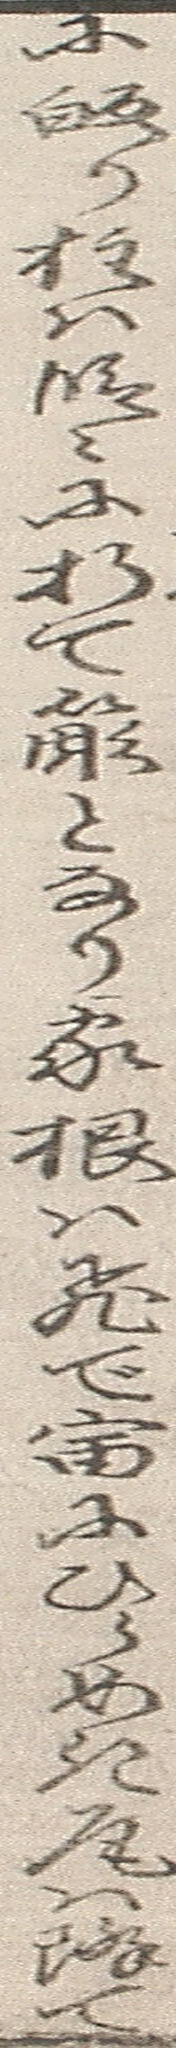に皈り柱ハ段々に折て簓となり家根ハ飛で宙にひらめき瓦ハ降て
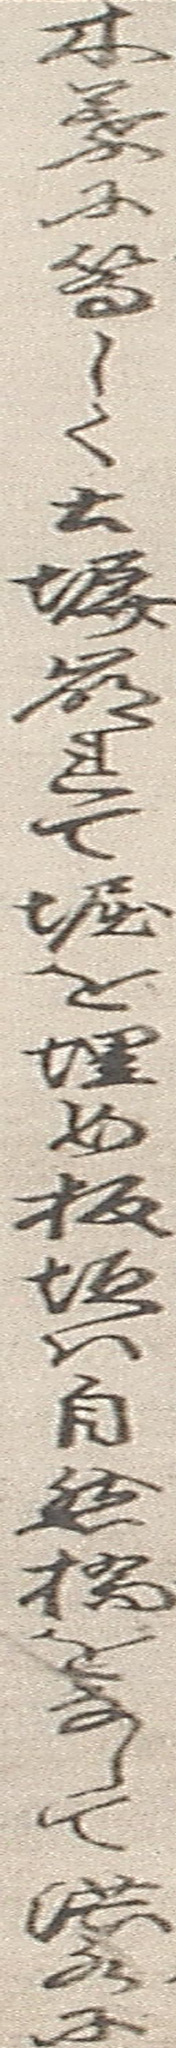木葉に等しく土塀崩れて堀を埋め板垣ハ自然橋をなして洪水に
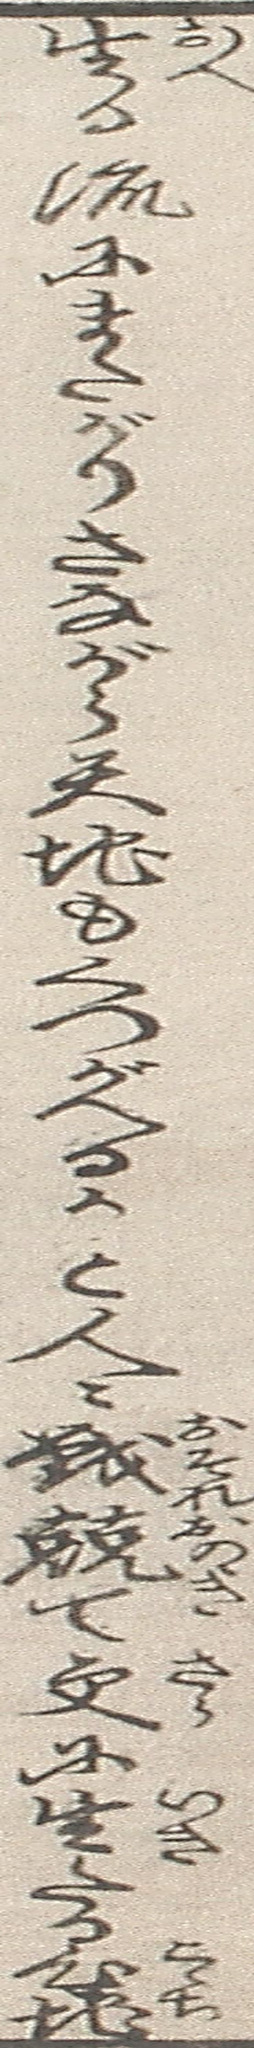生る流にまたがりさながら天地もくつがへるかと人々戦兢て更に生たる心地
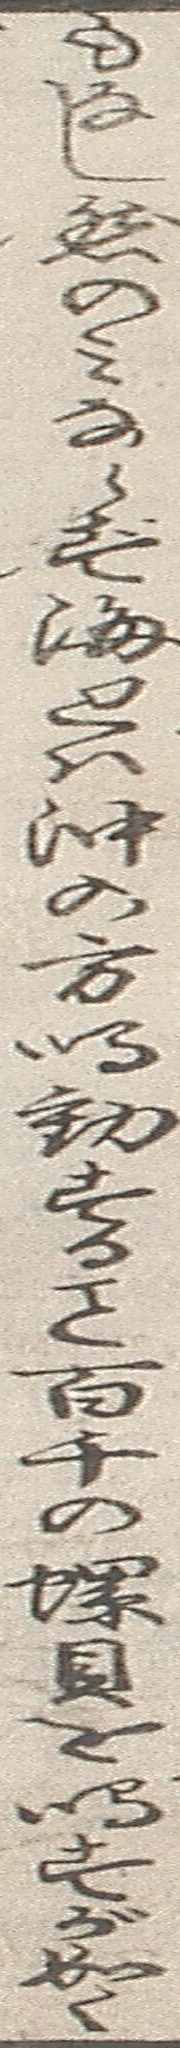もなし然のミならず海辺ハ沖の方鳴動すること百千の螺貝を鳴すが如く
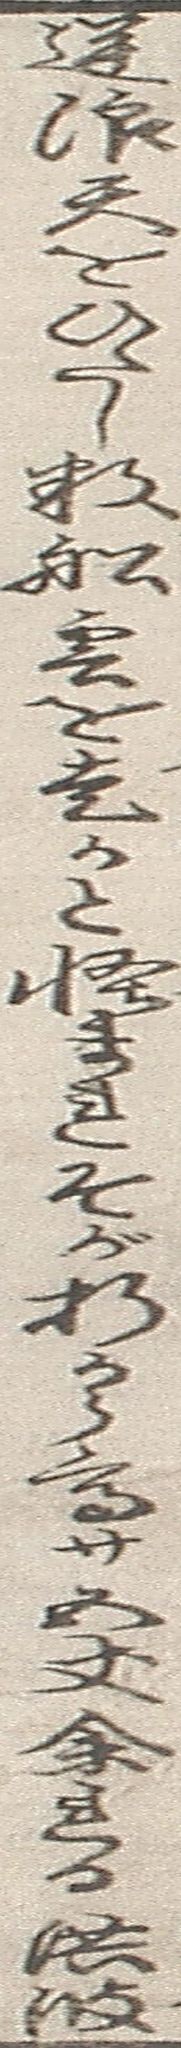逆浪天をひたし数船雲を走かと怪まれそが折から高サ五丈余れる洪波
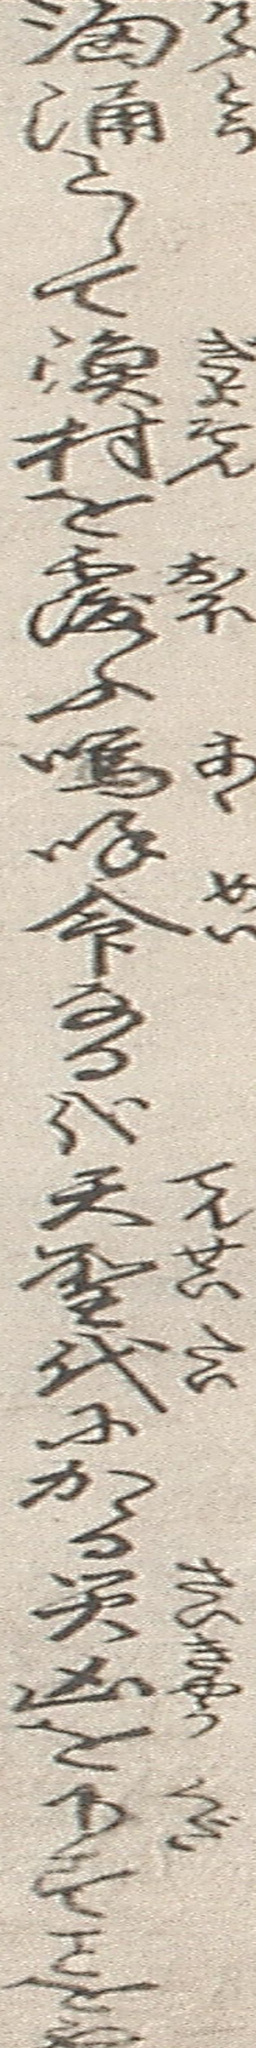洶涌として漁村を覆ふ嗚呼命なる哉天聖代にかゝる災凶を下すことをや
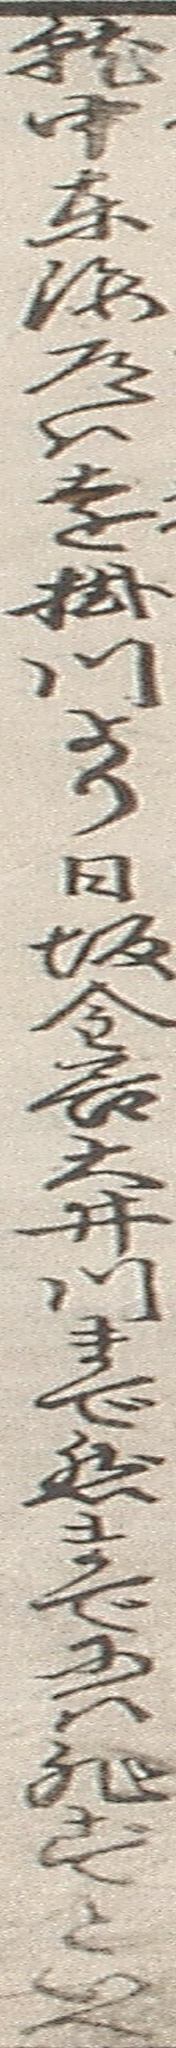就中東海道ハ遠掛川より日坂金谷大井川まで然までハ非ずといへ
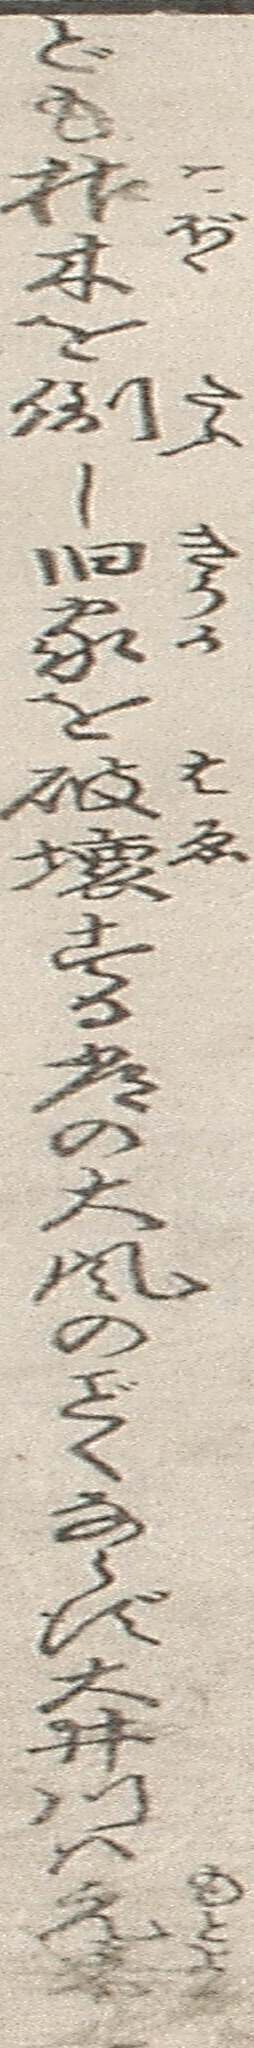ども枯木を倒し旧家を破壊する常の大風のごとくならず大井川ハ元來にて
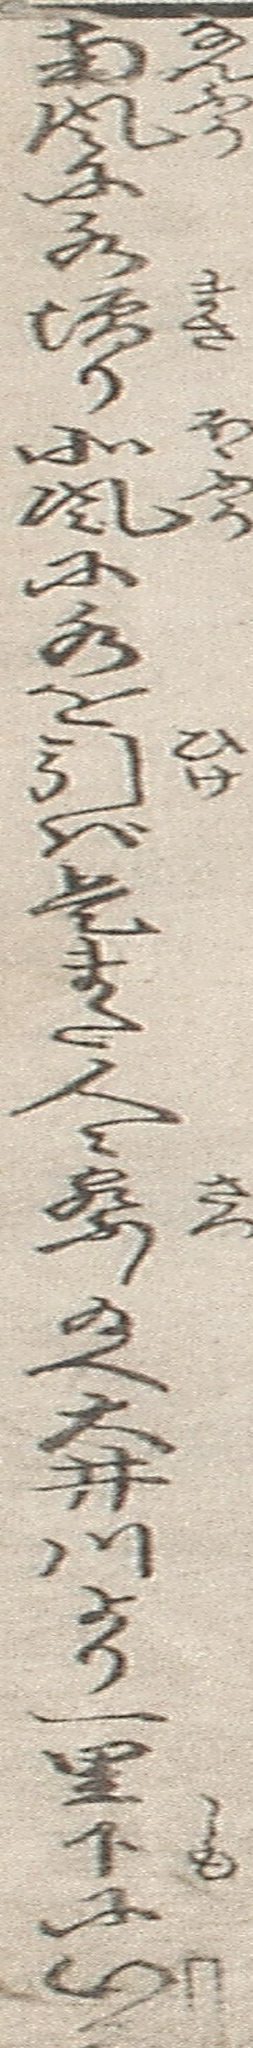南風に水増り北風に水を引バ是また人々察し給へ大井川より一里下にいろ
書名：安政風聞集　上中下　全
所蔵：東京大学地震研究所図書室 Earthquake Research Institute Library, The University of Tokyo, JAPAN
